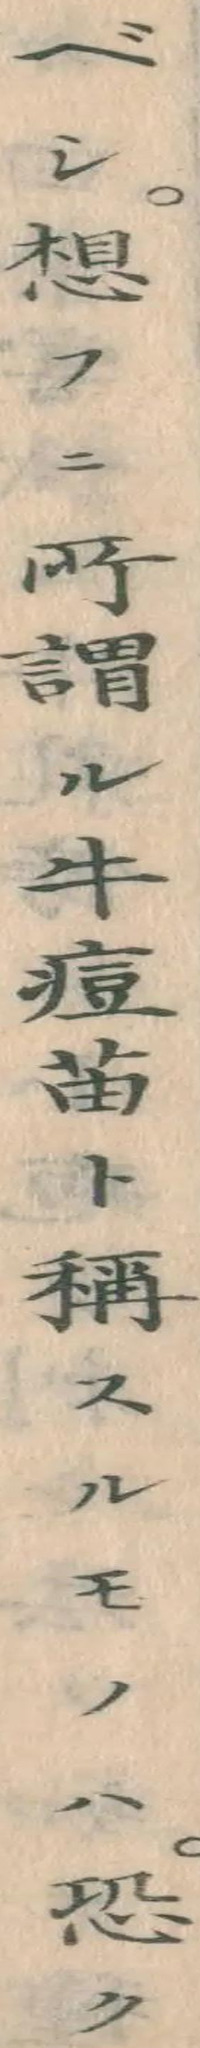ベシ。想フニ所謂ル牛痘苗ト称スルモノハ。恐ク
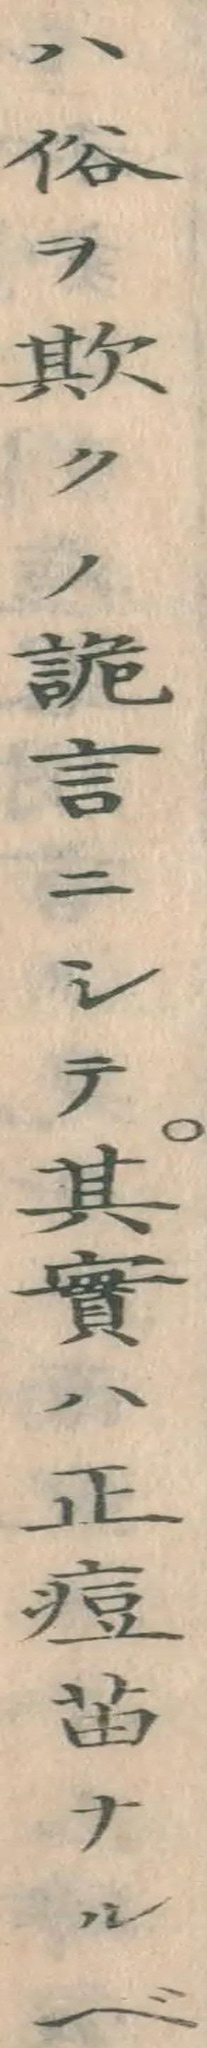ハ俗ヲ欺クノ詭言ニシテ。其実ハ正痘苗ナルベ

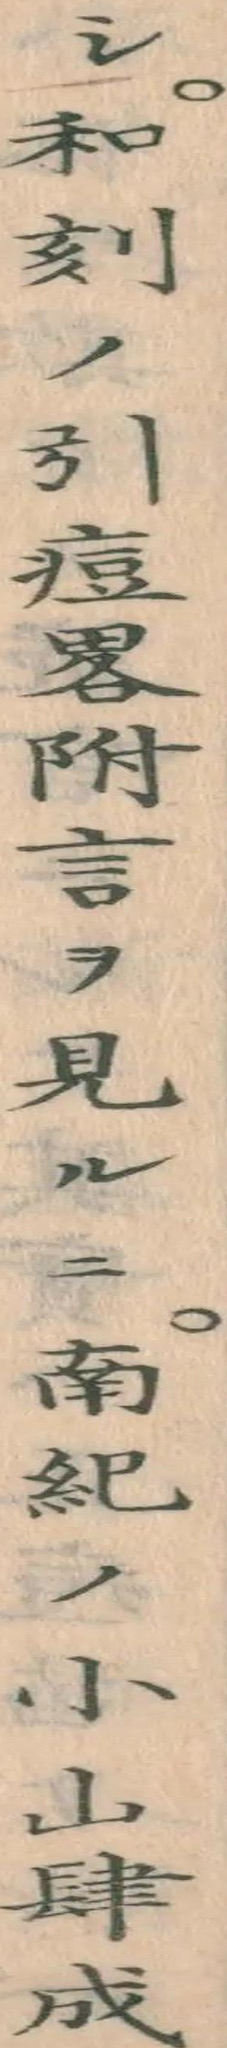シ。和刻ノ引痘略附言ヲ見ルニ。南紀ノ小山肆成
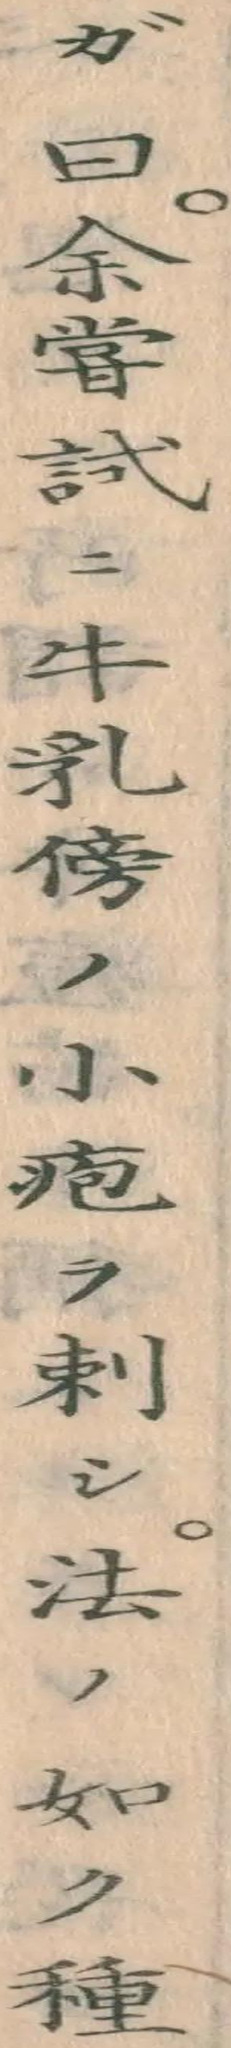ガ曰。余嘗試ニ牛乳傍ノ小疱ヲ刺シ。法ノ如ク種
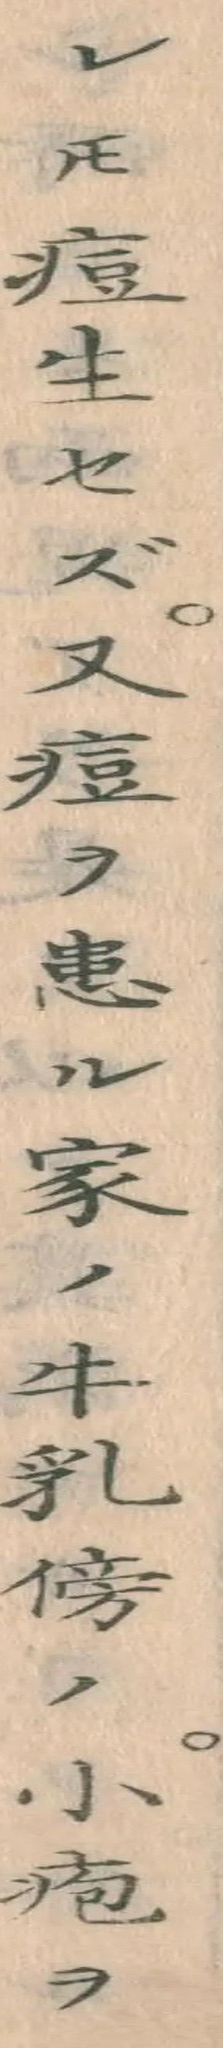レ𪜈痘生セズ。又痘ヲ患ル家ノ牛乳傍ノ。小疱ヲ
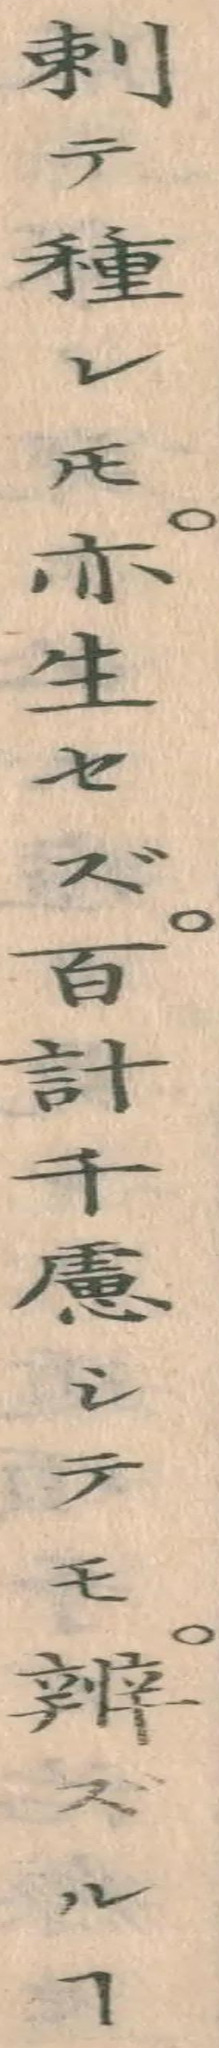刺テ種レ𪜈。亦生セズ。百計千慮シテモ。弁ズルヿ
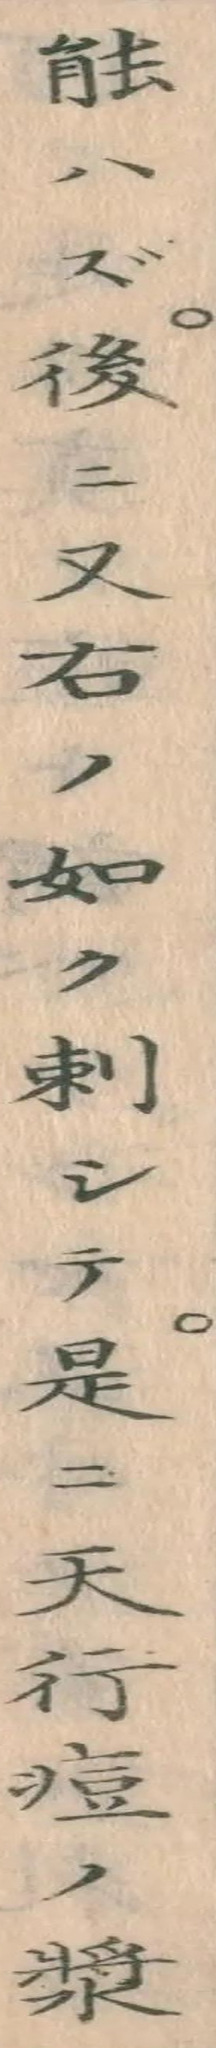能ハズ。後ニ又右ノ如ク刺シテ。是ニ天行痘ノ漿
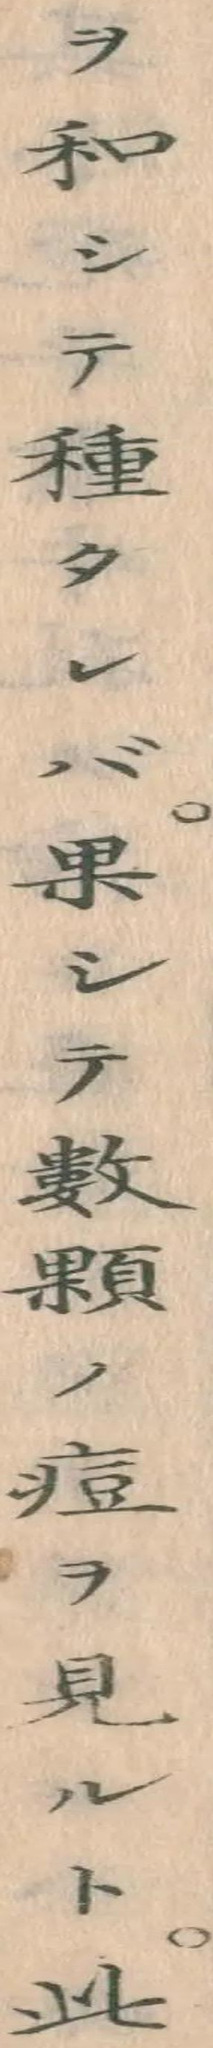ヲ和シテ種タレバ。果シテ数顆ノ痘ヲ見ルト。此
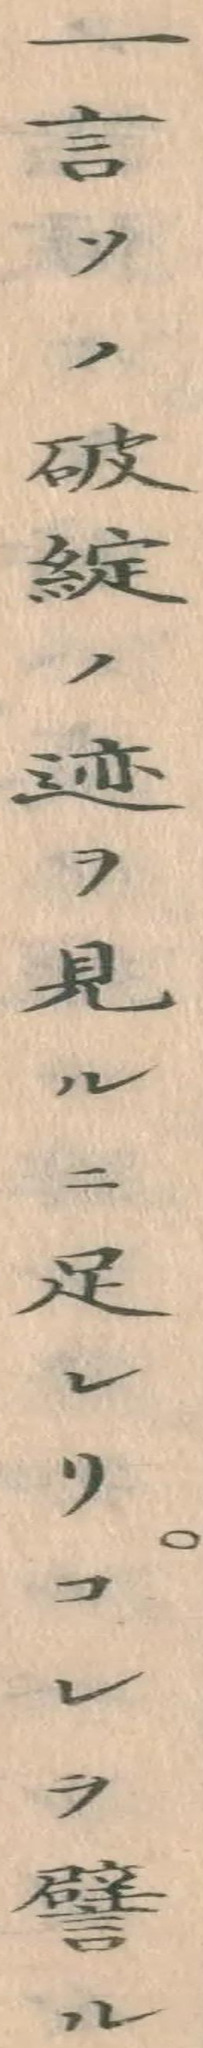一言ソノ破綻ノ迹ヲ見ルニ足レリ。コレヲ譬ル
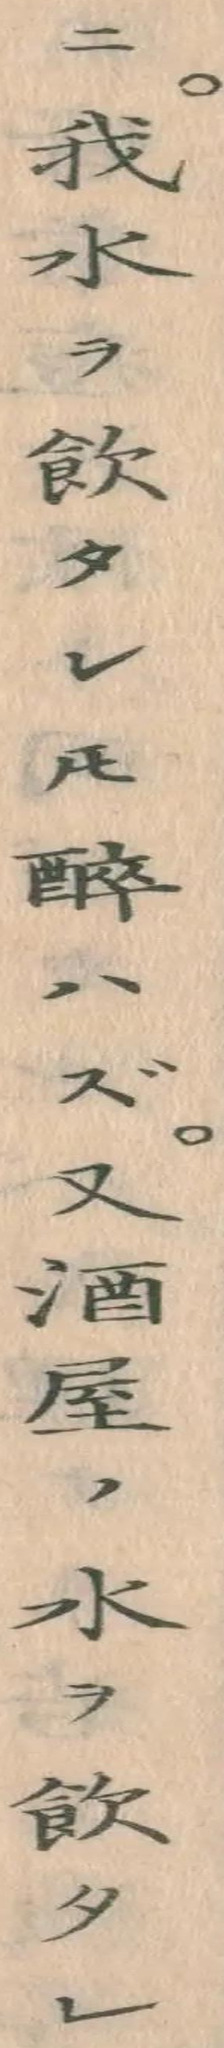ニ。我水ヲ飲タレ𪜈酔ハズ。又酒屋ノ水ヲ飲タレ
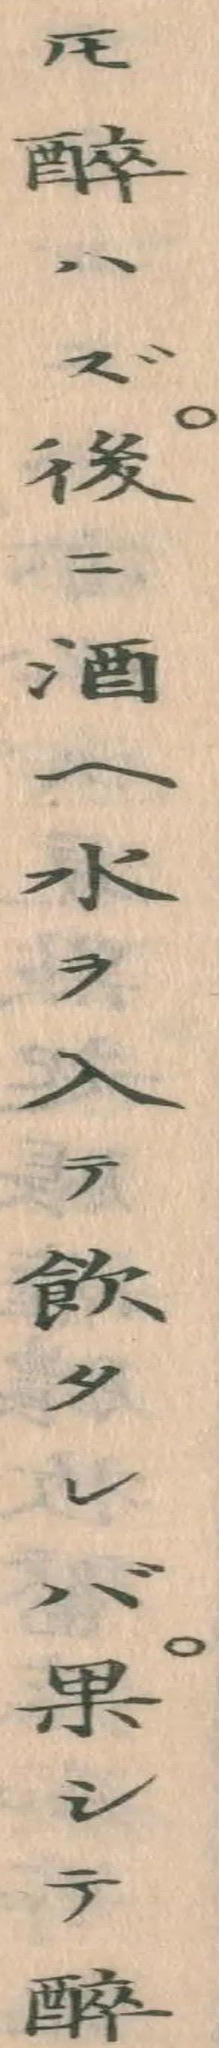𪜈酔ハズ。後ニ酒ヘ水ヲ入テ飲タレバ。果シテ酔
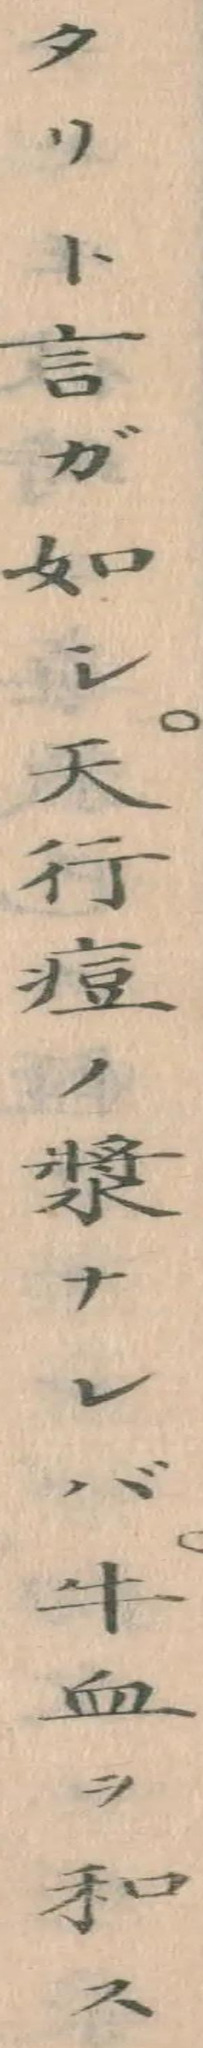タリト言ガ如シ。天行痘ノ漿ナレバ。牛血ヲ和ス
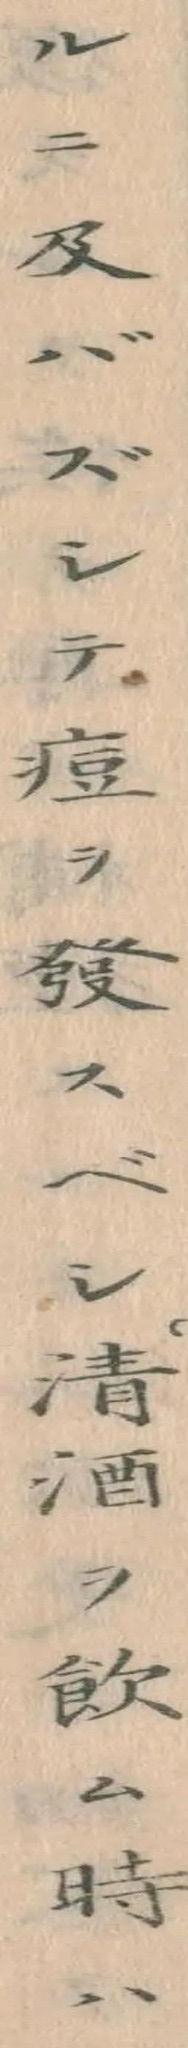ルニ及バズシテ。痘ヲ発スベシ。清酒ヲ飲ム時ハ。
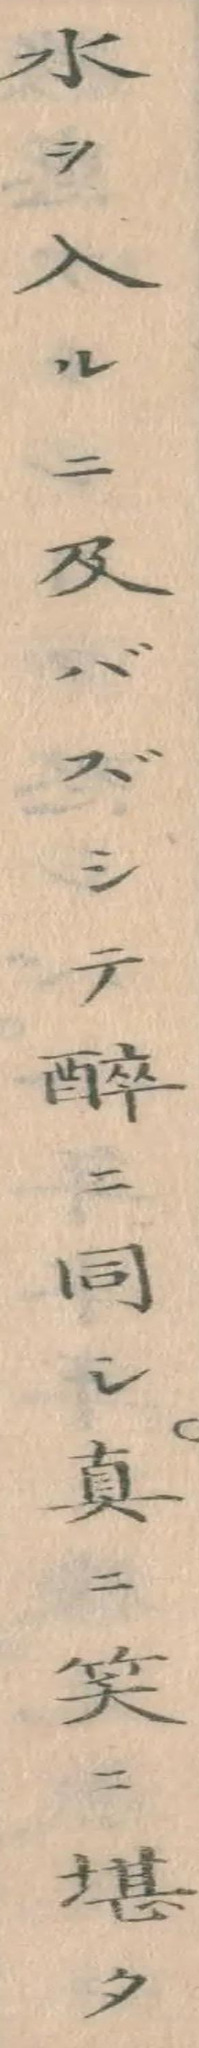水ヲ入ルニ及バズシテ酔ニ同シ。真ニ笑ニ堪タ
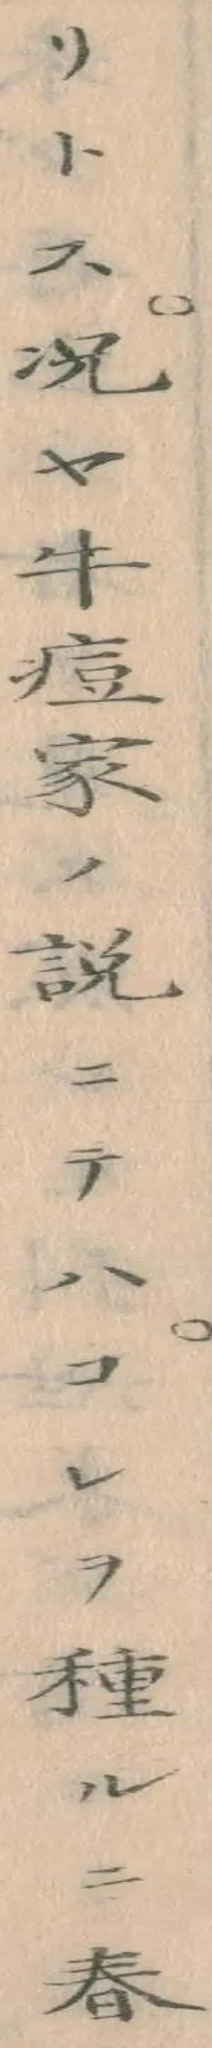リトス。況ヤ牛痘家ノ説ニテハ。コレヲ種ルニ春
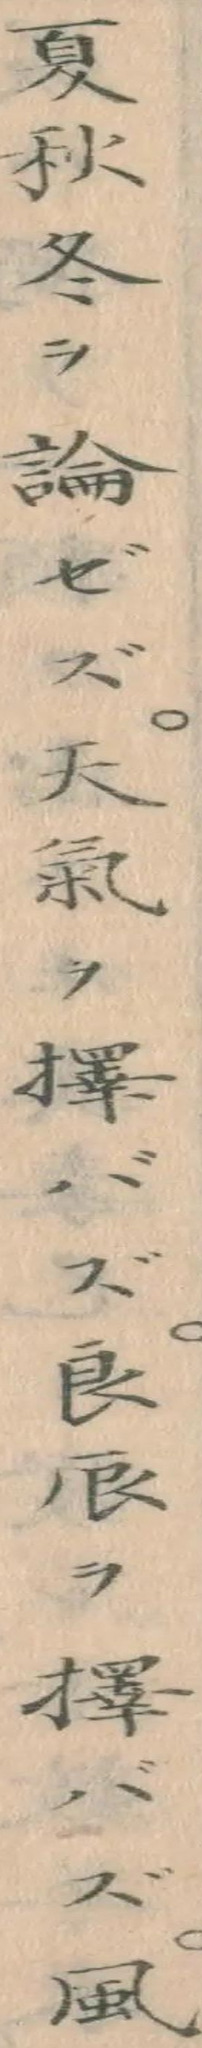夏秋冬ヲ論ゼズ。天気ヲ択バズ。良辰ヲ択バズ。風
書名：種痘弁義
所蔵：国立国会図書館 National Diet Library, JAPAN
